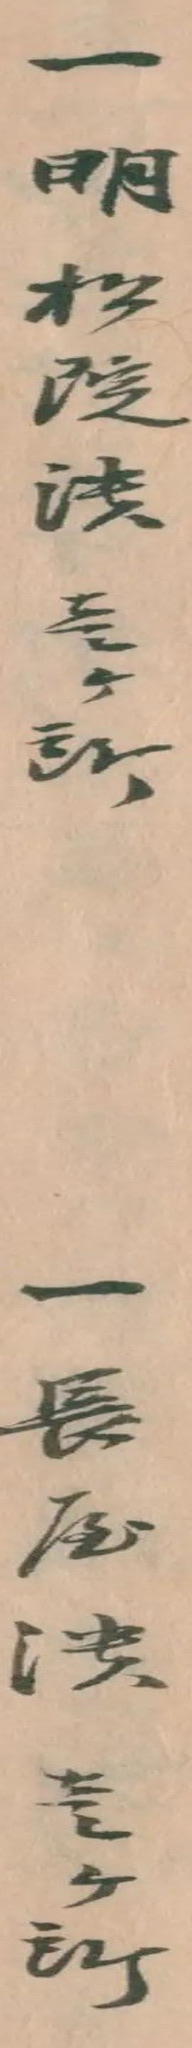一明松院潰壱ヶ所一長屋潰壱ヶ所
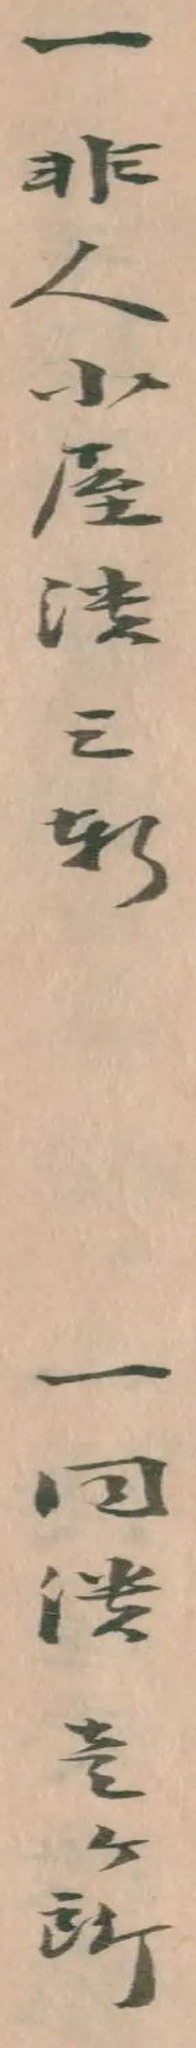一非人小屋潰三軒一同潰壱ヶ所
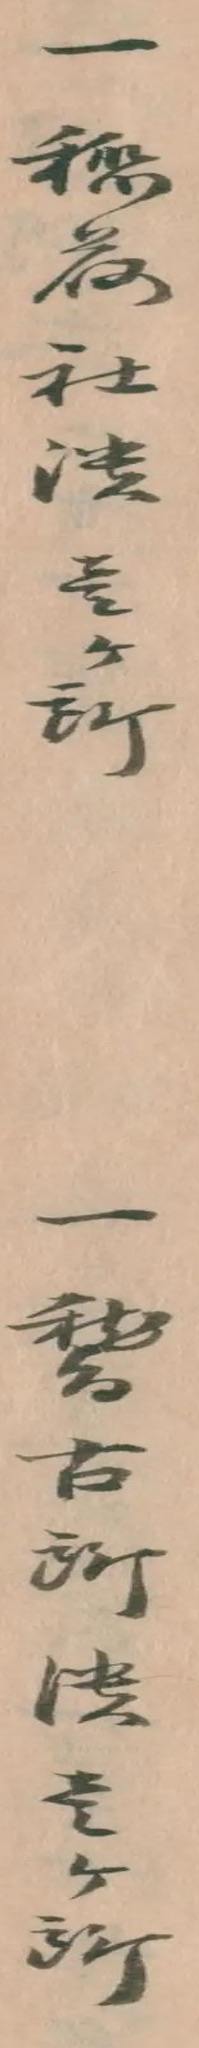一稲荷社潰壱ヶ所一稽古所潰壱ヶ所
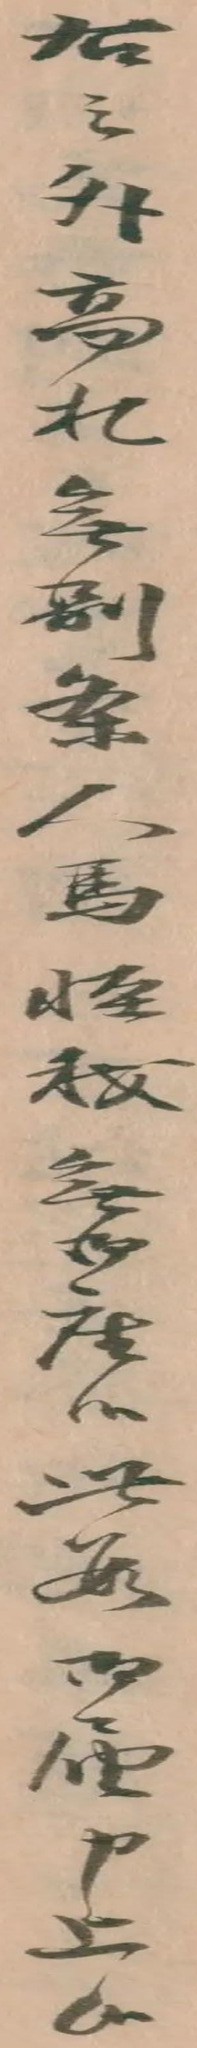右之外高札無別条人馬怪我無御座候此段御届申上候
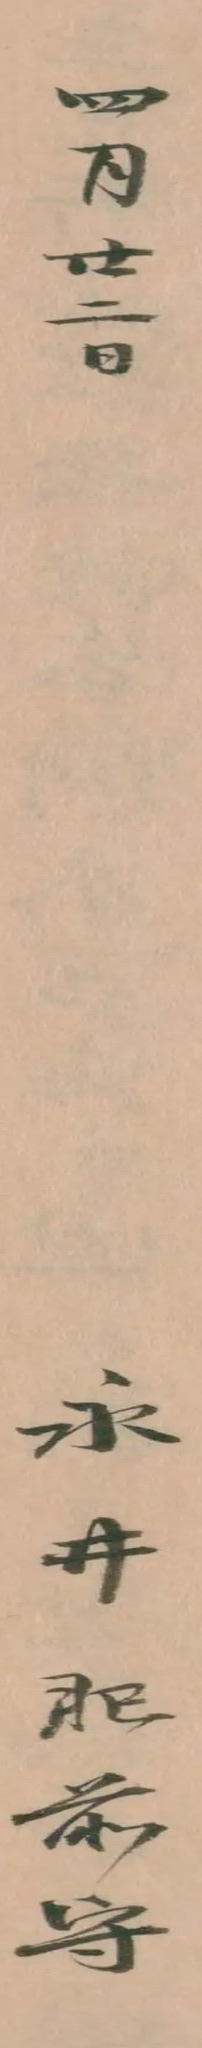四月廿二日永井肥前守
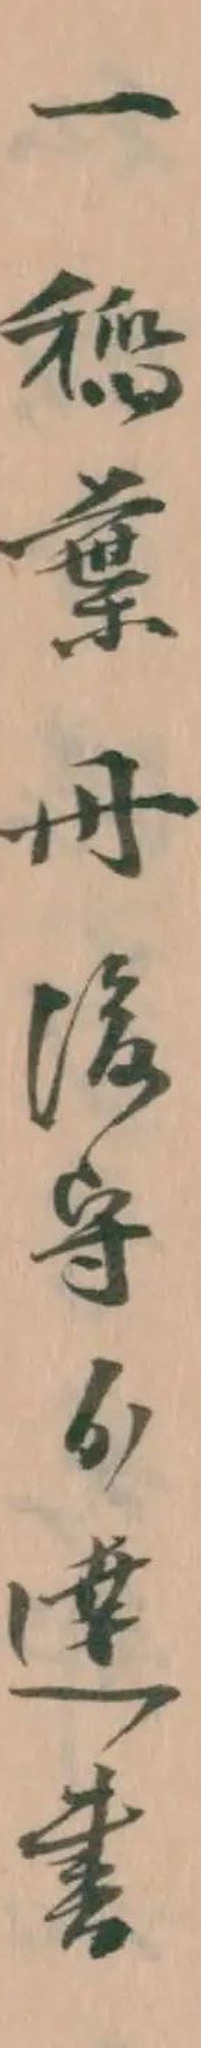一稲葉丹後守ゟ達書
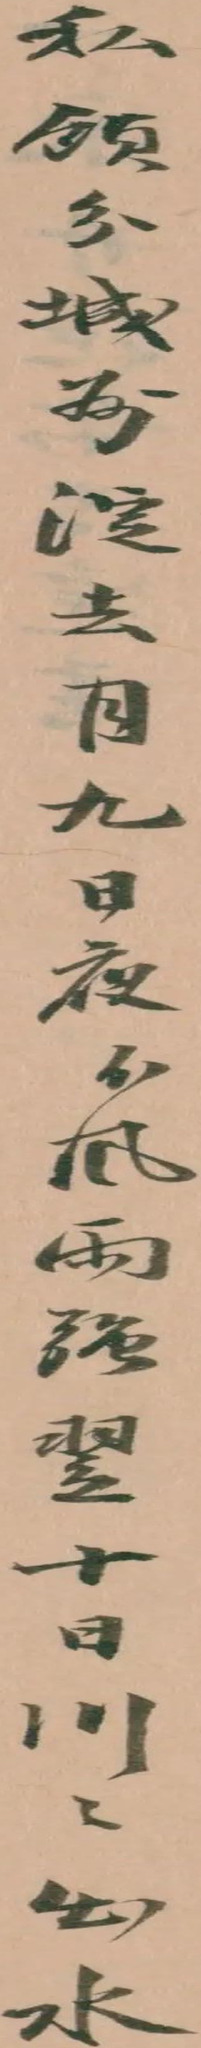私領分城州淀去月九日夜ゟ風雨強翌十日川々出水
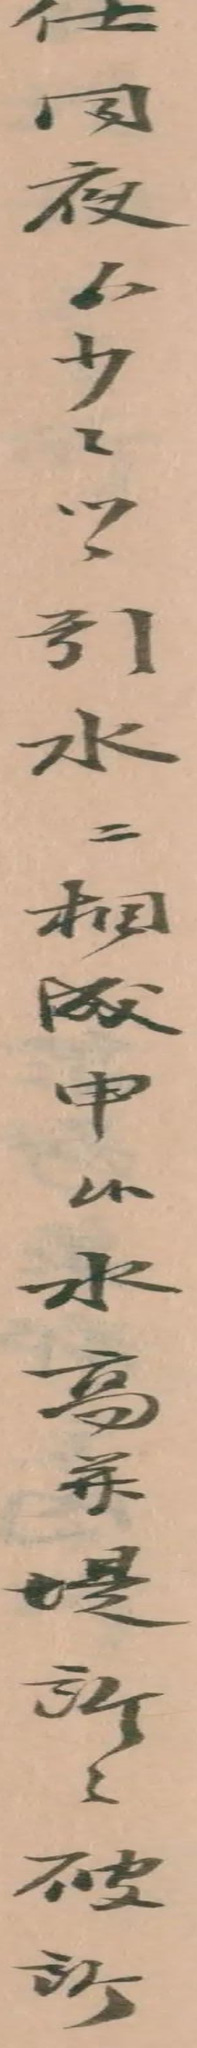仕同夜ゟ少々ツゝ引水二相成申候水高并堤所々破所
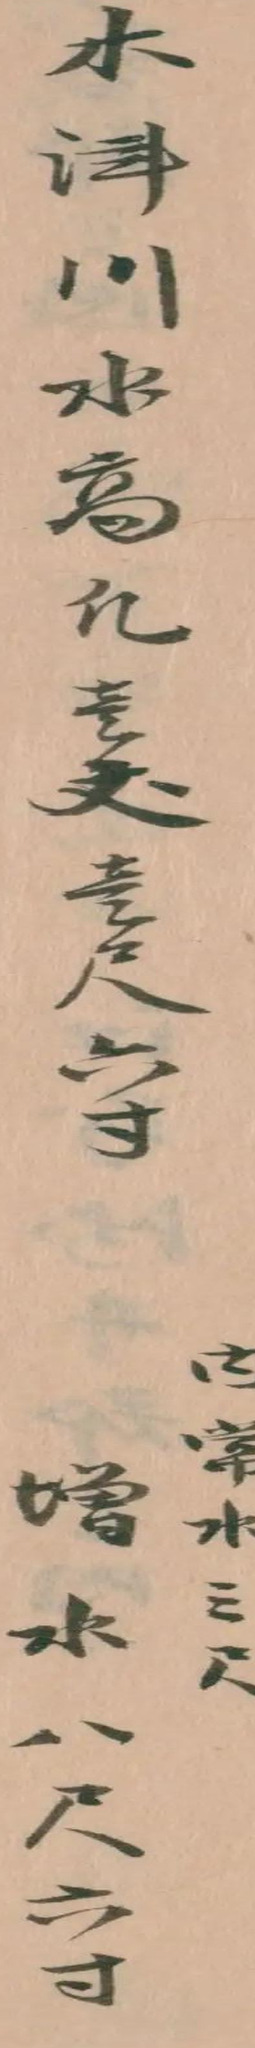木津川水高凡壱丈壱尺六寸内常水三尺
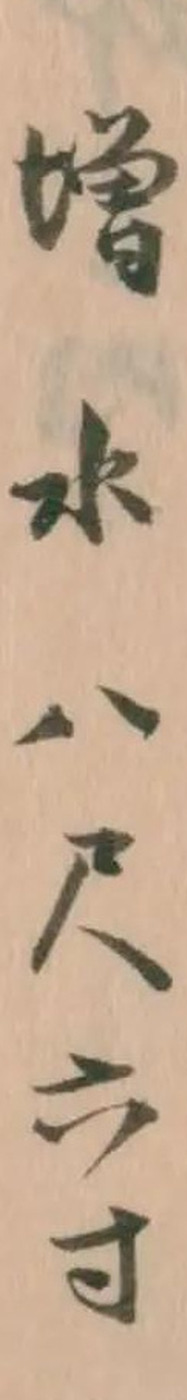増水八尺六寸
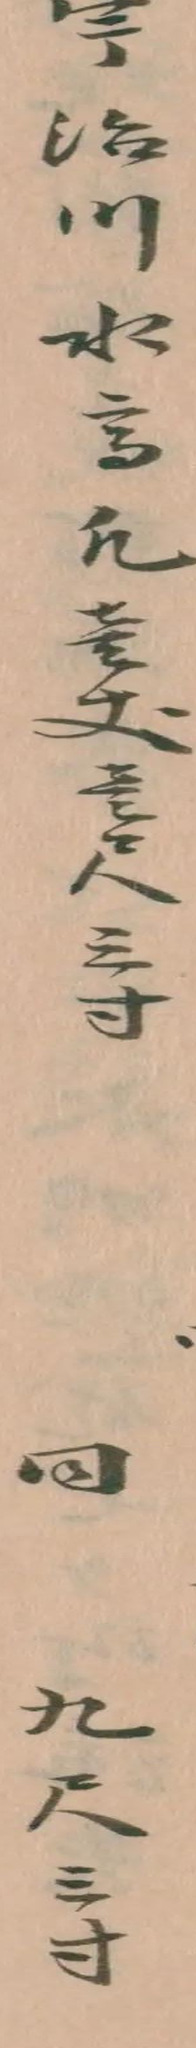宇治川水高凡壱丈壱尺三寸同二尺
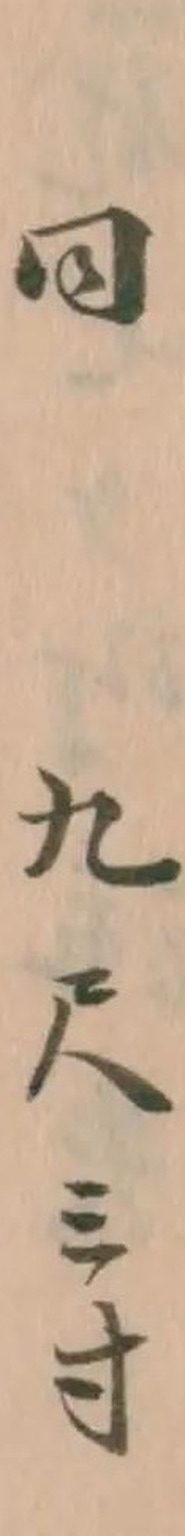同九尺三寸
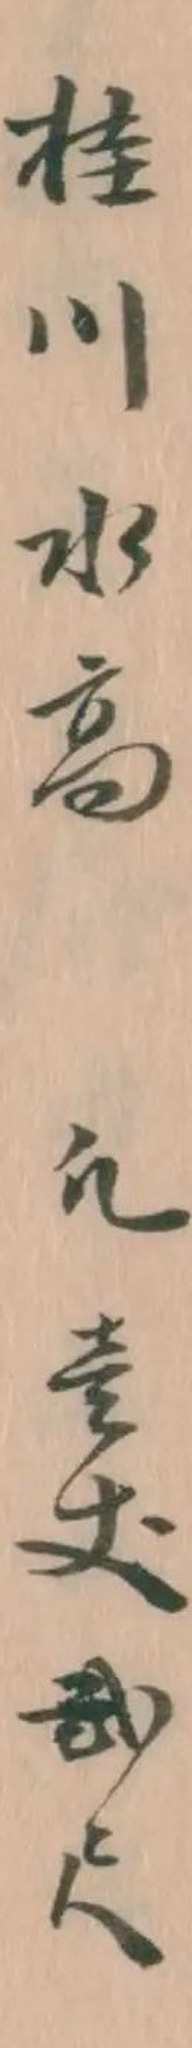桂川水高凡壱丈弐尺
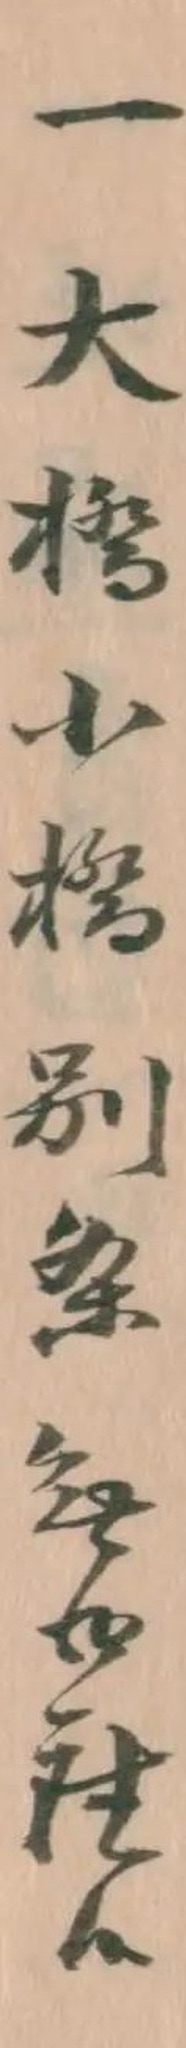一大橋小橋別条無御座候
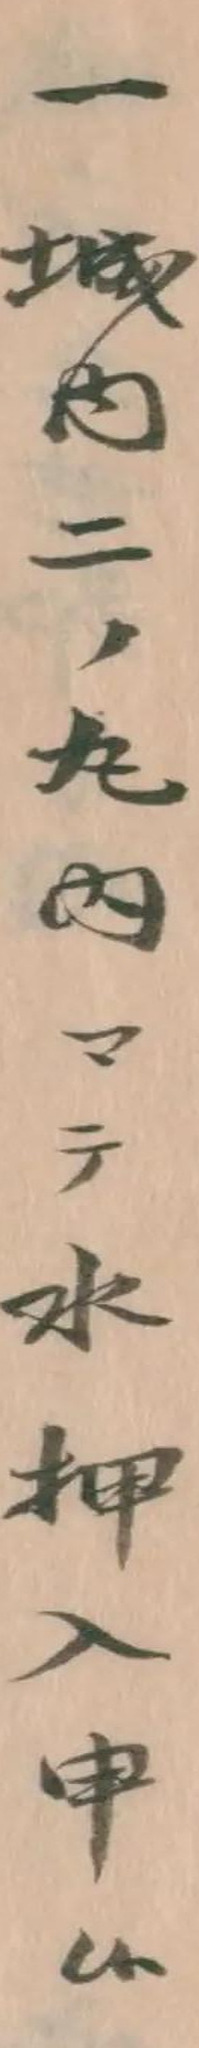一城内二ノ丸マテ水押入申候
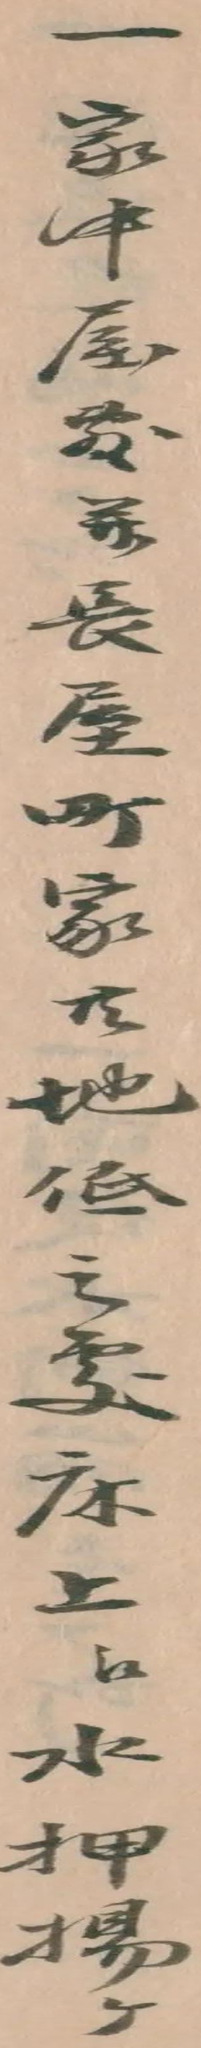一家中屋敷并長屋町家共地低之処床上江水押揚ヶ
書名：地災撮要. 巻3(地震之部)-巻4(噴火之部)
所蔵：国立国会図書館 National Diet Library, JAPAN
